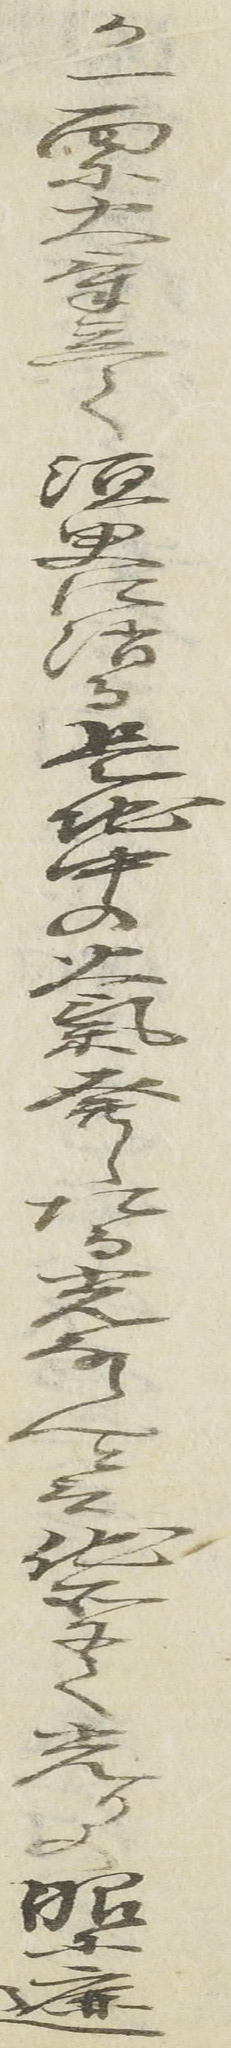か一面に火気なく須臾に消る是地中の火気発したる光ならんと云他所にて光りの眼に遮
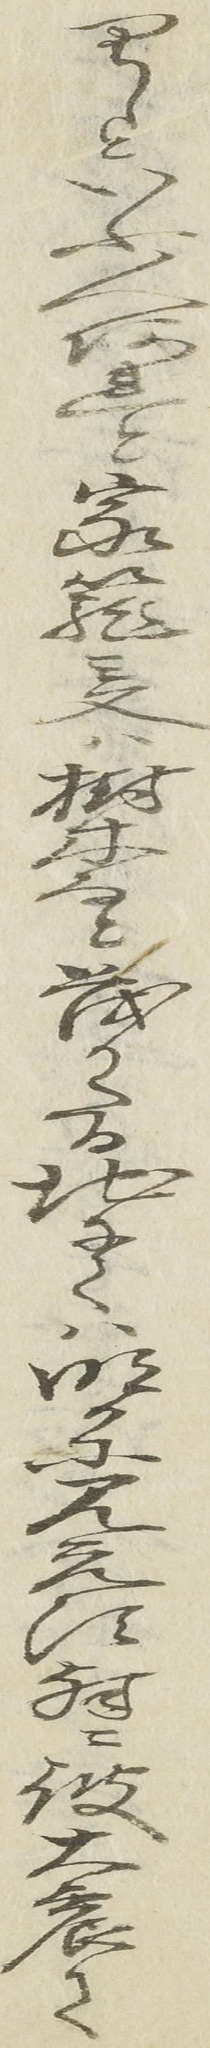りしといふ人あれと家籠ミ又ハ樹木なと茂りたる地にてハ明かに見えす殊ニ彼大震に
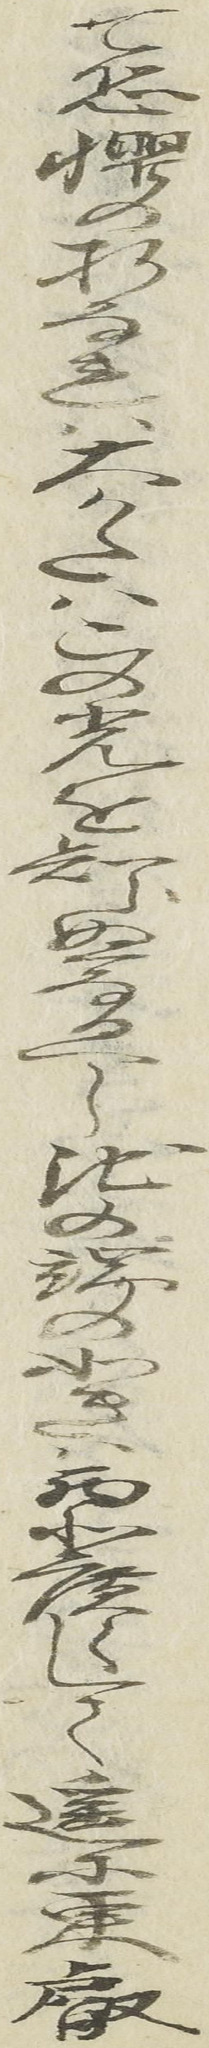て恐懼の折なれハ大かたハこの光を知らぬなるへし池の端の如きハ西北広くして遥に東叡
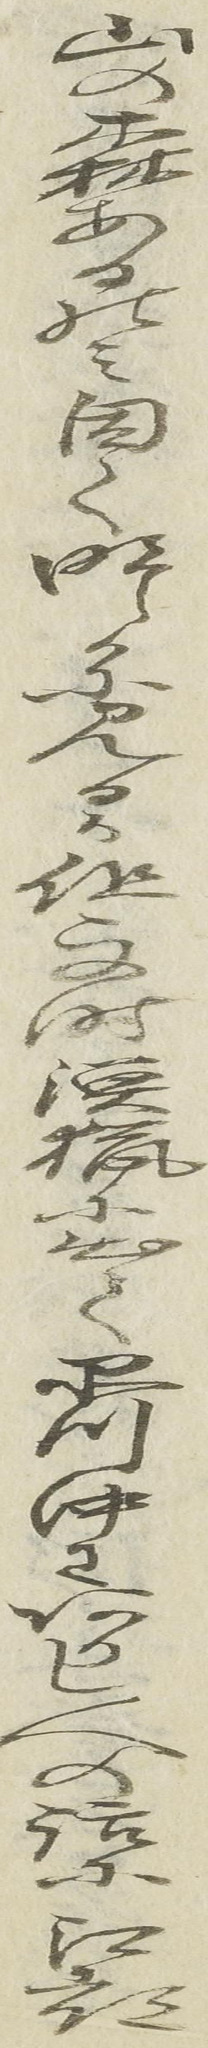山の森あるのミ因て時々に見るか但この時漁猟に出て品川沖にありし人の話に江都
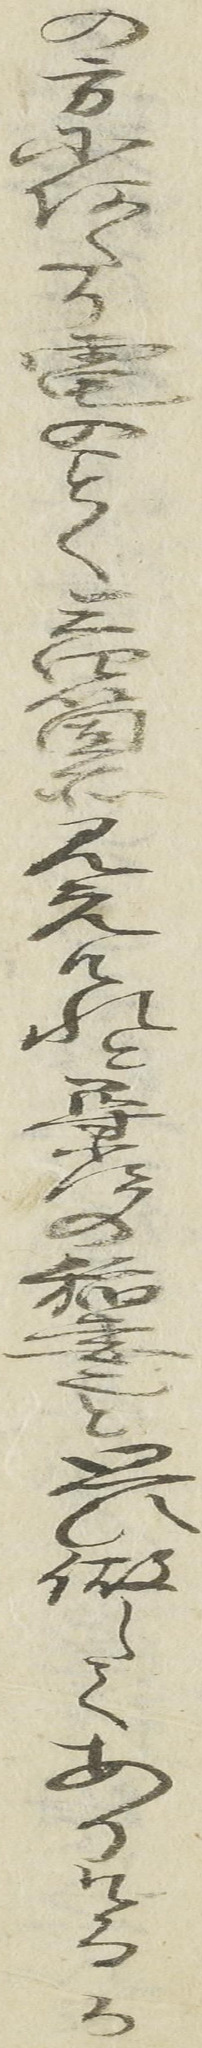の方にあたり電のことく三四箇所見えケれと尋常の稲妻也と思ひ做してありケるか
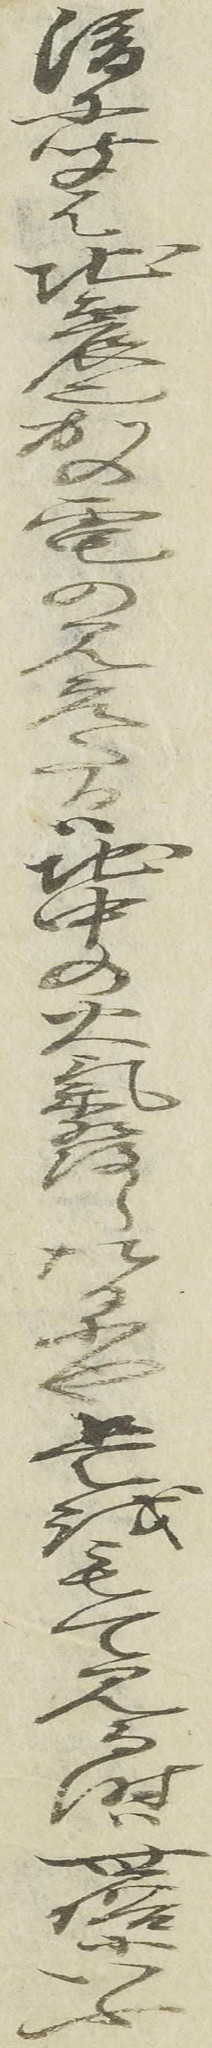後に聞は地震なりかの電の見えたるハ地中の火気発したるにや是をもて見る時ハ世俗にいふ

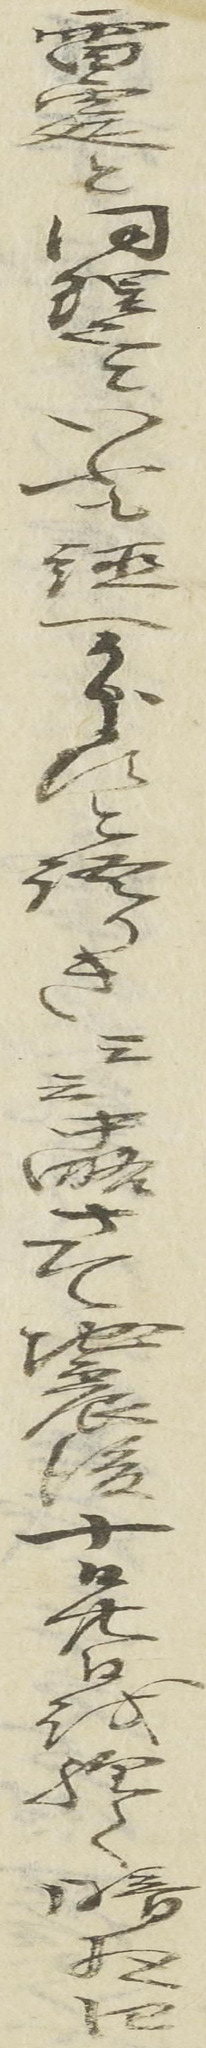雷霆と同程也といふも誣へからすと語りき云云中略さて地震後十日廿日を経て暗夜四
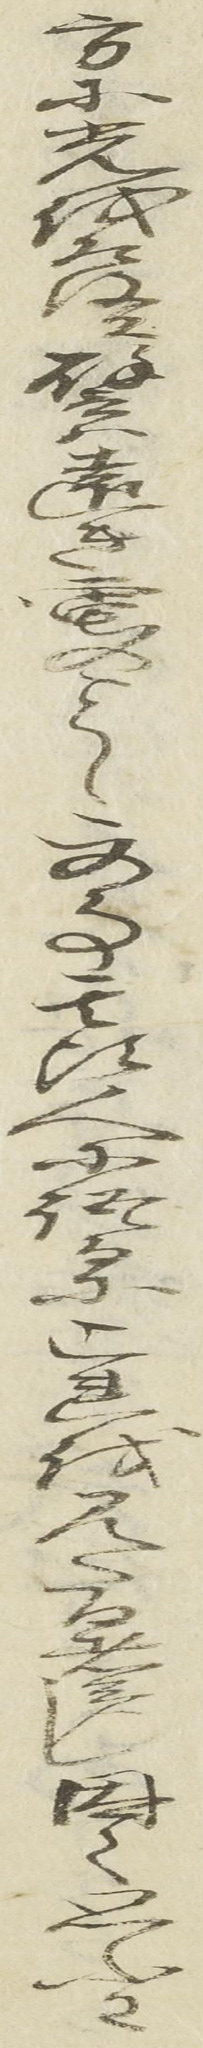方に光を発ス譬ハ遠き電のことしこの事其頃人に語るにこれを見たる者多し因て思ふに
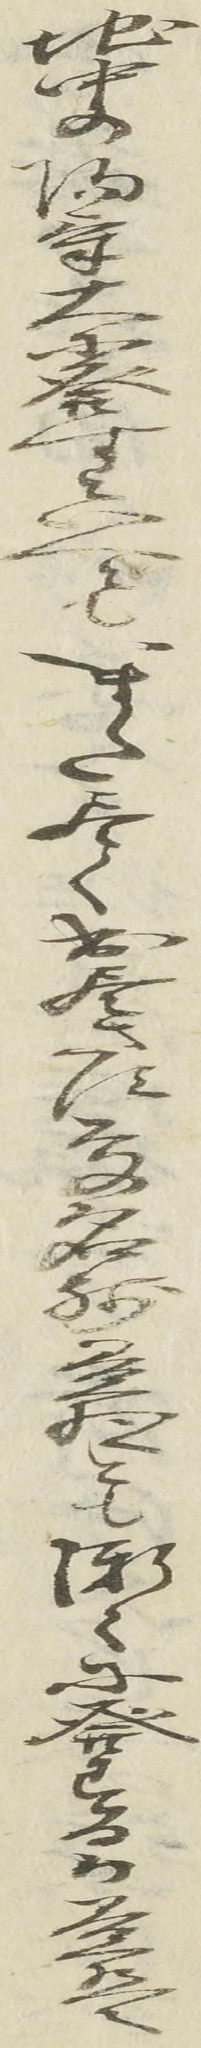地中の湯気大ニ発すといへともいまた尽く出尽さすその名残昼夜とも漸〻に発するか昼は
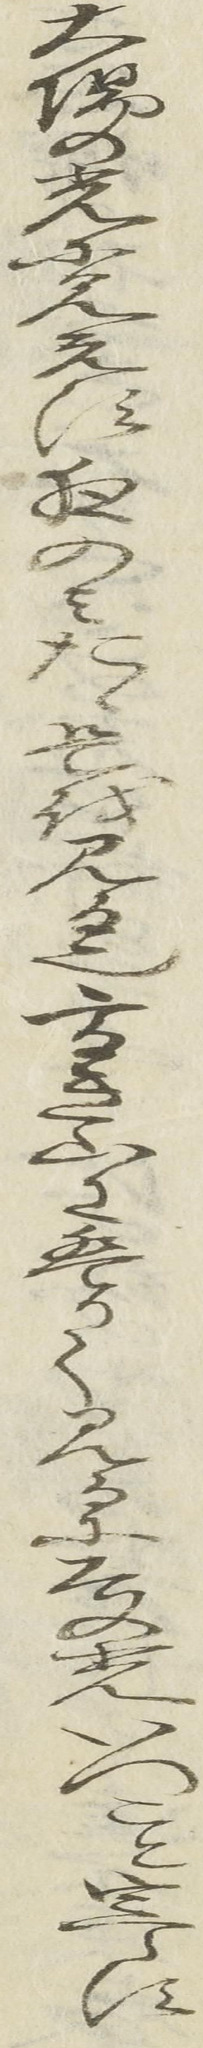大陽の光に見えす夜のミたゝ是を見る也高き山に登りて見るにその光りいつこと定らす
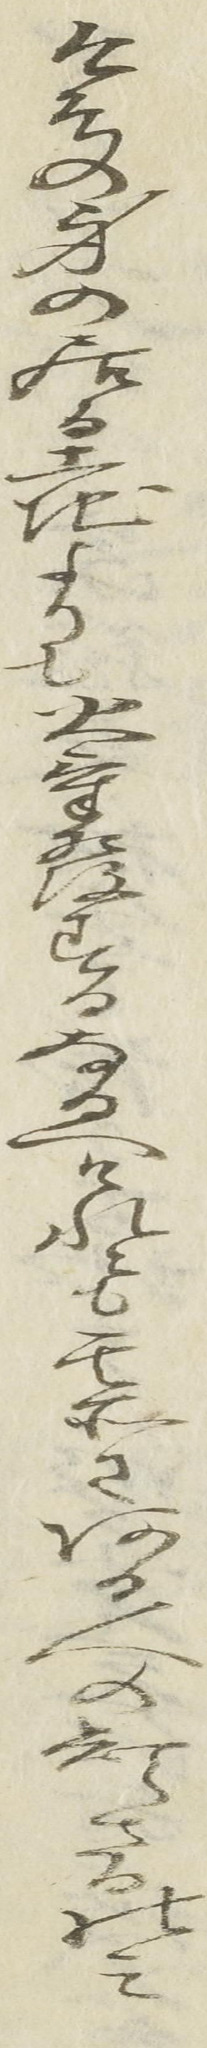今その身の居る土地よりも火気発するなるへケれとも其所にある人の知らさるのミ
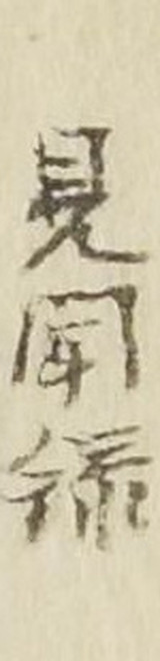見聞録
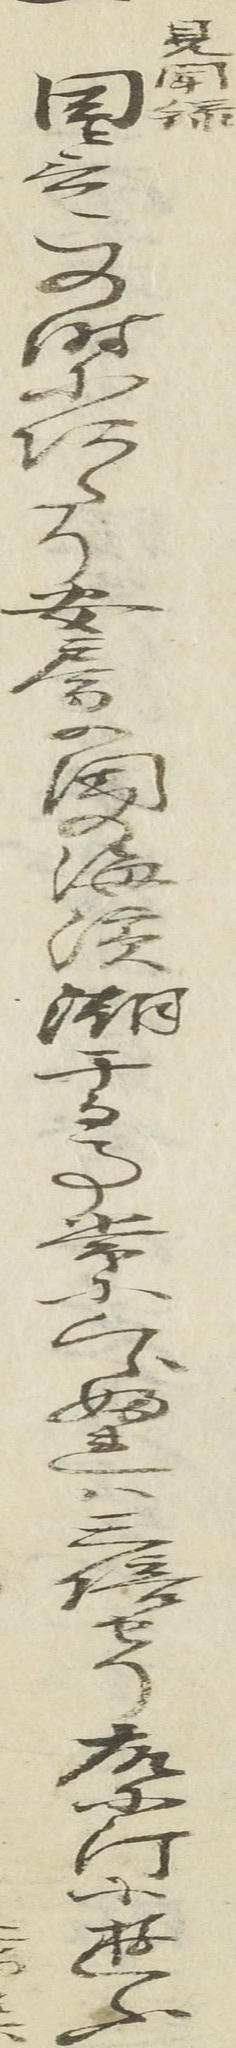一因ニ云この時にあたり安房の国の海濱潮干る事常にくらふれハ三倍セり故に汀に遊ふ
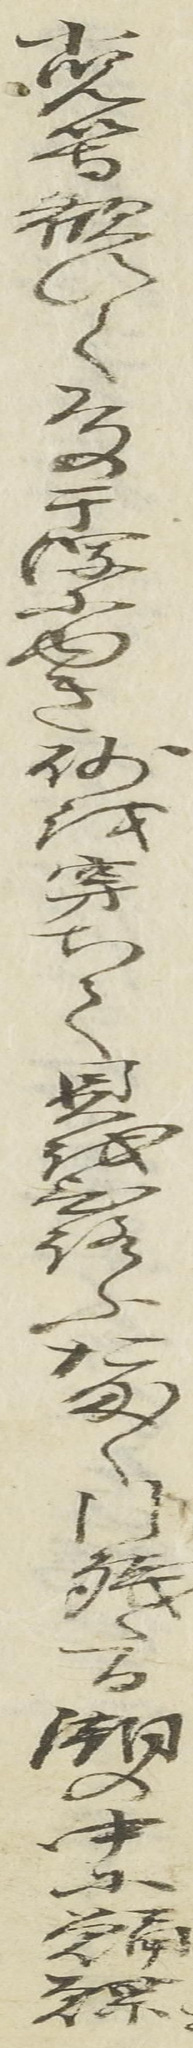小児等歓ひてその干潟にゆき砂を穿ちて貝をひろふたま〳〵引残たる潮の中に鯒鰈
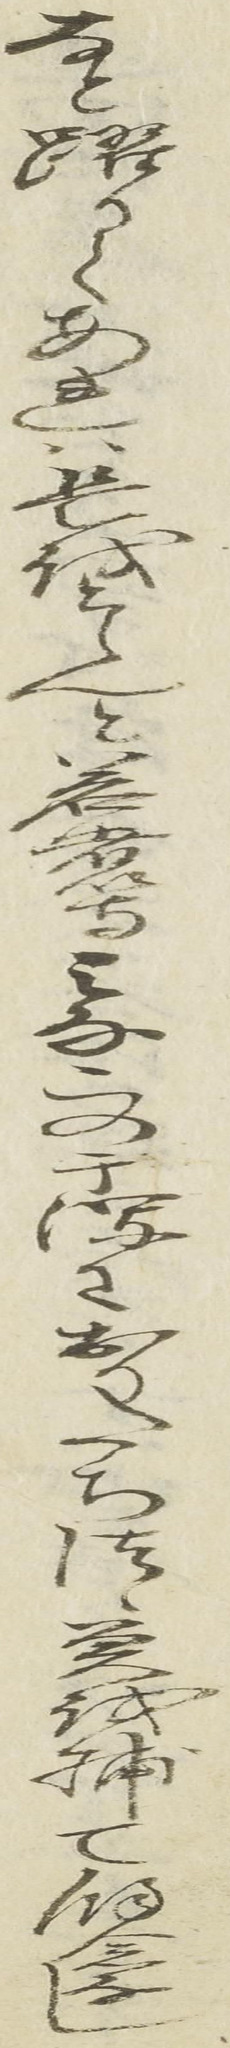なと躍りてあれハ是をとらんと若者等ミなこの干潟におりたちつゝ魚を捕て余念なし
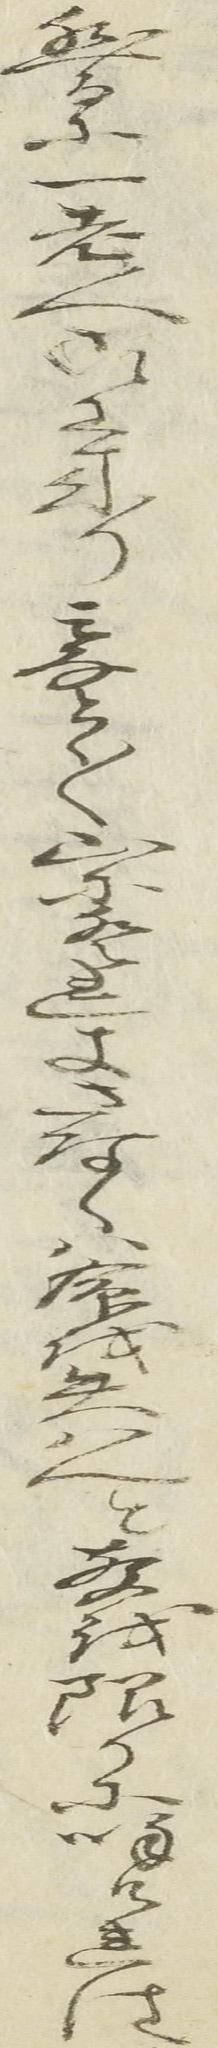然るに一老人こゝに来りミなとく〳〵山に登れよさなくハ命を失ハんと聲を限りに呼ケれは
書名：安政乙卯江戸大地震筆記　安政丙辰八月大阪大雷雨之記追加　安政三辰年七月松前辺大地震并八月大風雨記録
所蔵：東京大学地震研究所図書室 Earthquake Research Institute Library, The University of Tokyo, JAPAN
